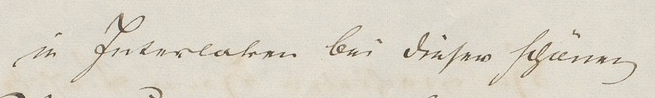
in Interlaken bei dieser schönen
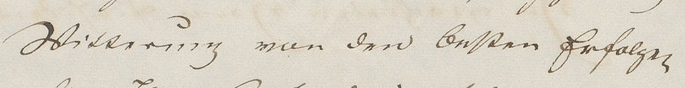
Witterung von den besten Erfolgen
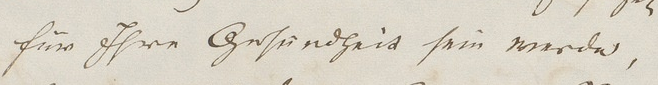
für Ihre Gesundheit sein werde,
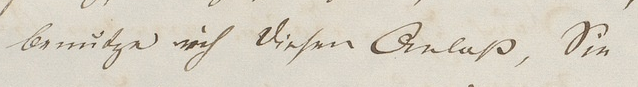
benutze ich diesen Anlaß, Sie
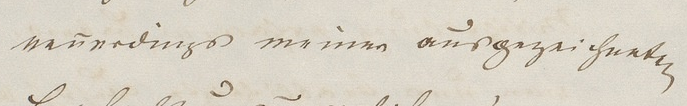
neuerdings meiner ausgezeichneten
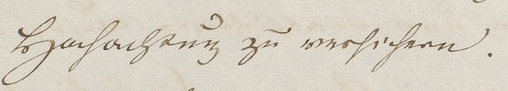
Hochachtung zu versichern.
